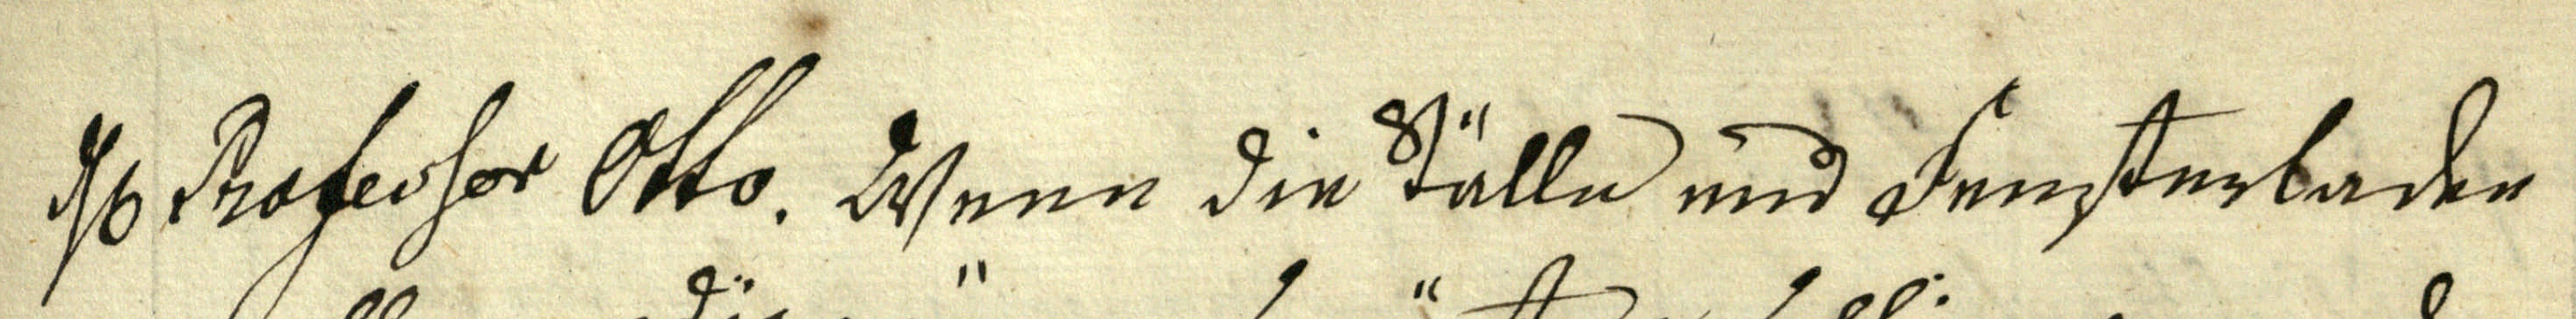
dh Professor Otto. Wenn die Ställe und Fensterladen
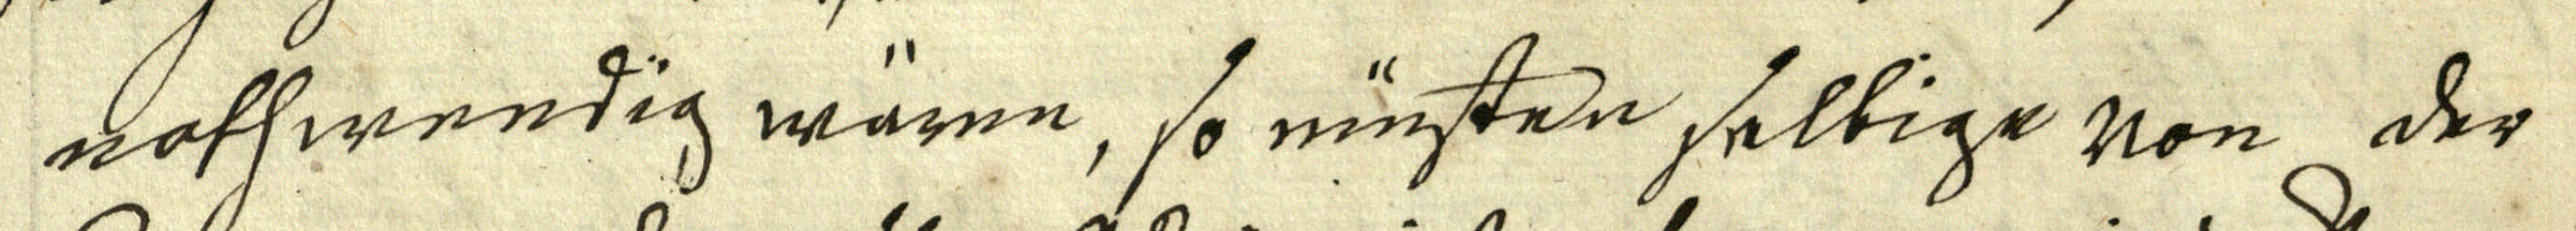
nothwendig wären, so müsten selbige von der
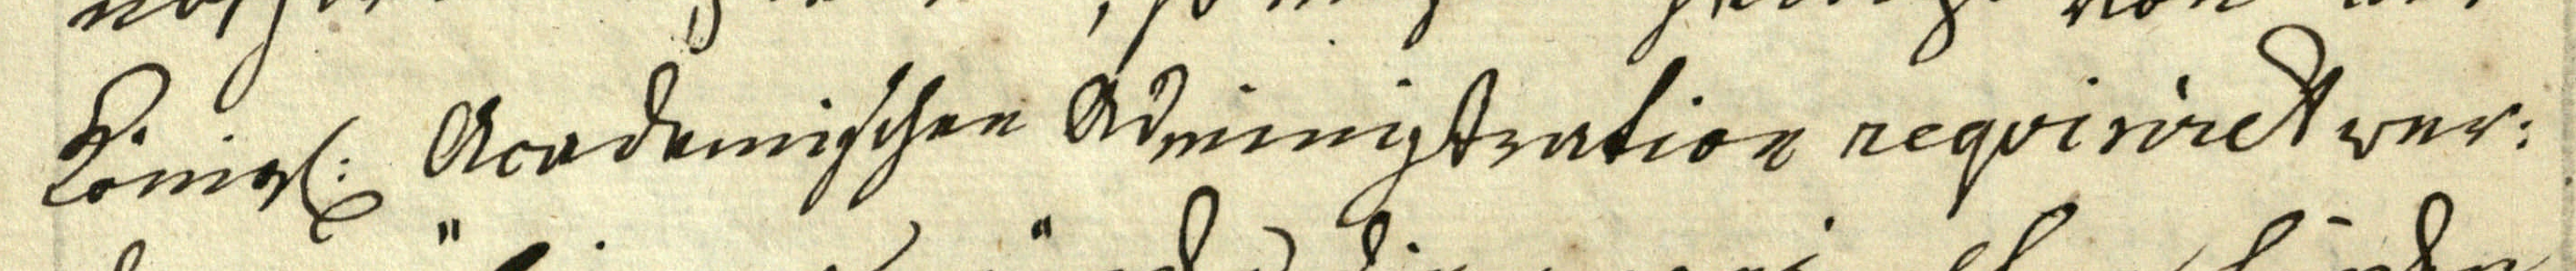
Königl. Academischen Administration requiriret wer¬
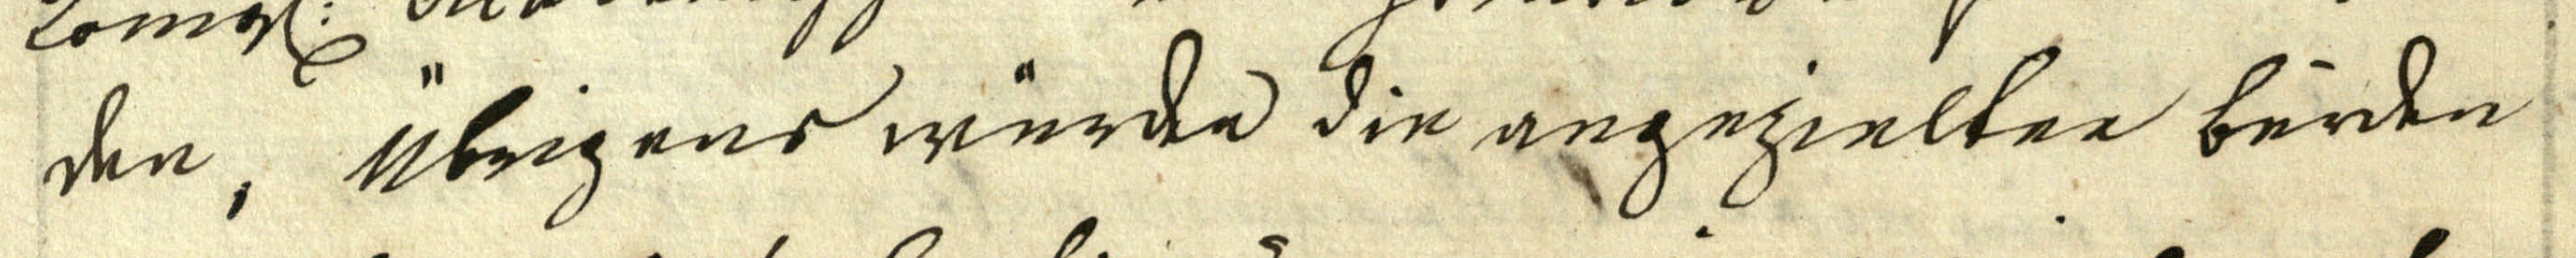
den, Übrigens würden die angezielten beiden
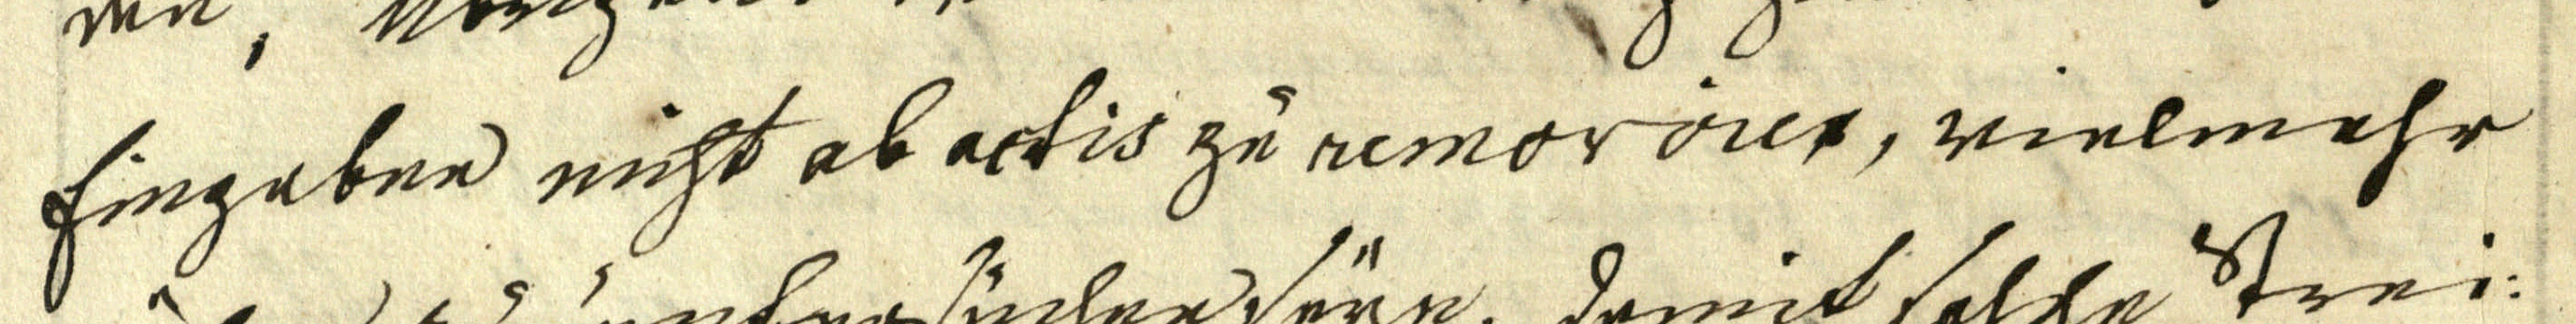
Eingaben nicht ab actis zu removiren, vielmehr
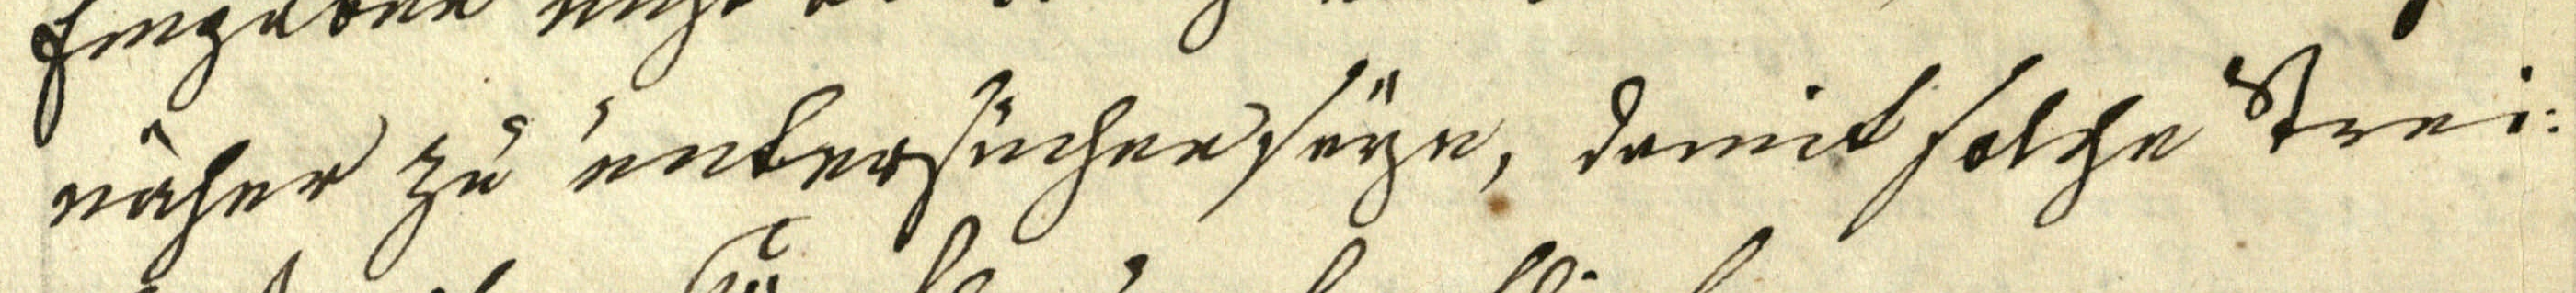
näher zu untersuchen seÿn, damit solche Strei¬
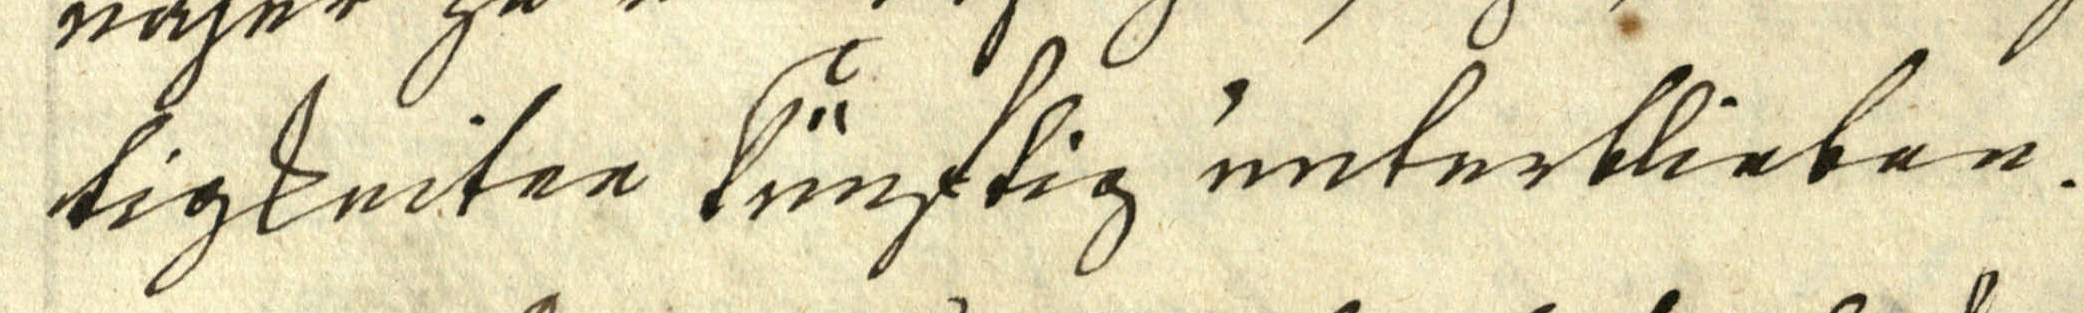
tigkeiten künftig unterblieben.
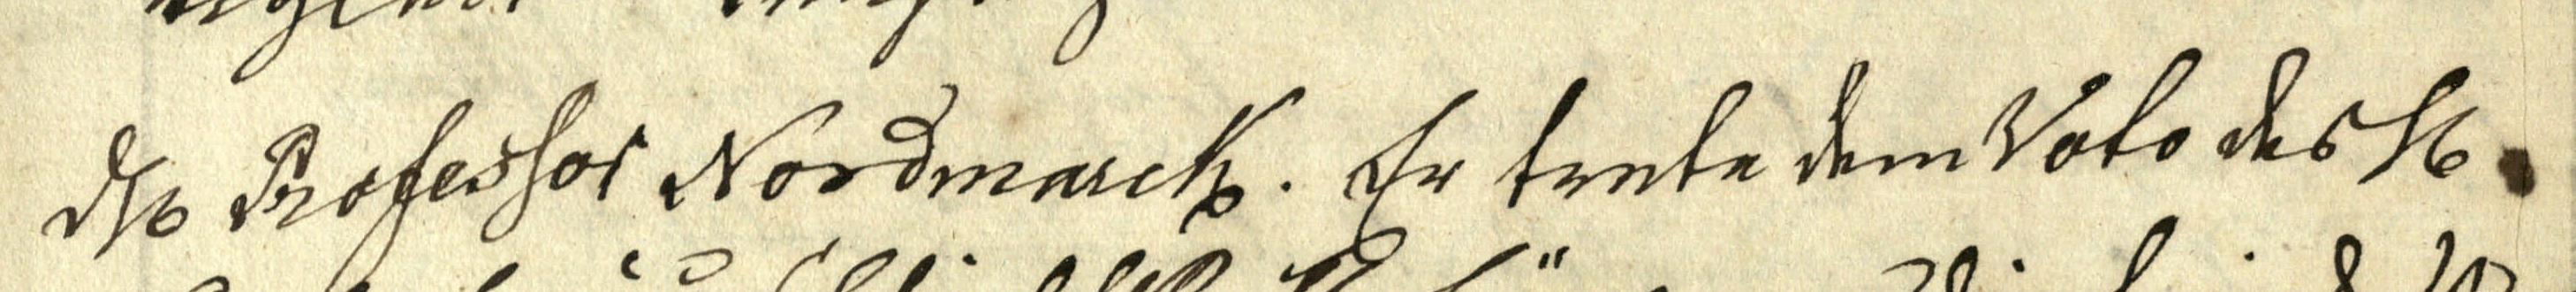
dh Professor Nordmarck. Er trete dem Voto des H
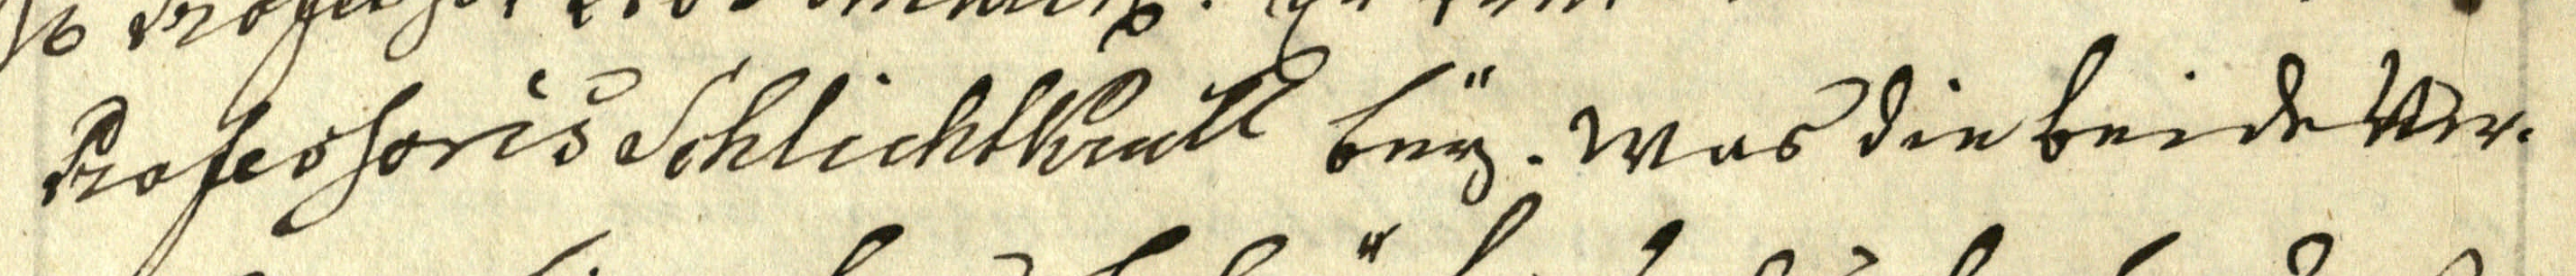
Professoris Schlichtkrull beÿ. Was die beide ver ¬
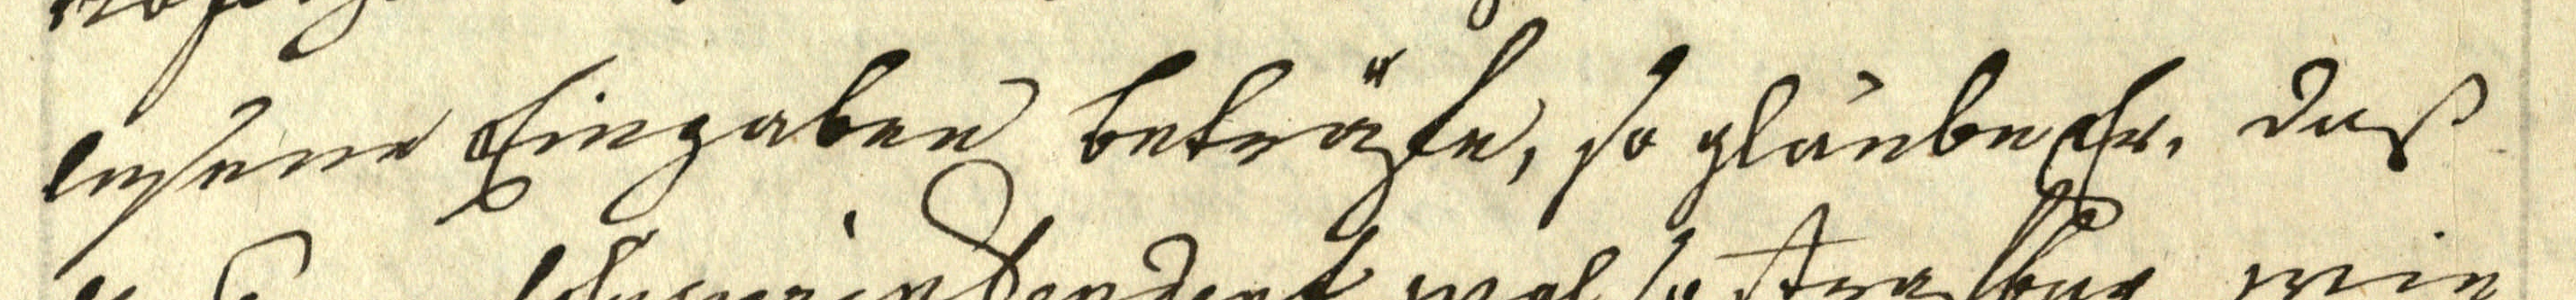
lesene Eingaben beträfe, so glaube Er, daß
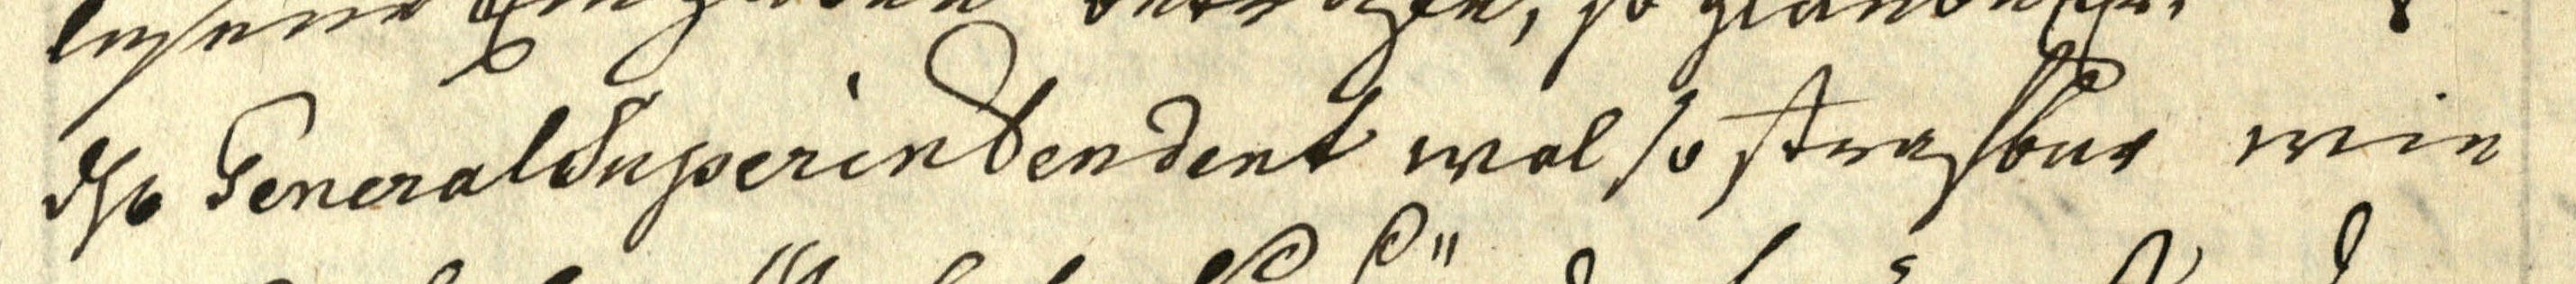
dh GeneralSuperintendent wol so strafbar wie
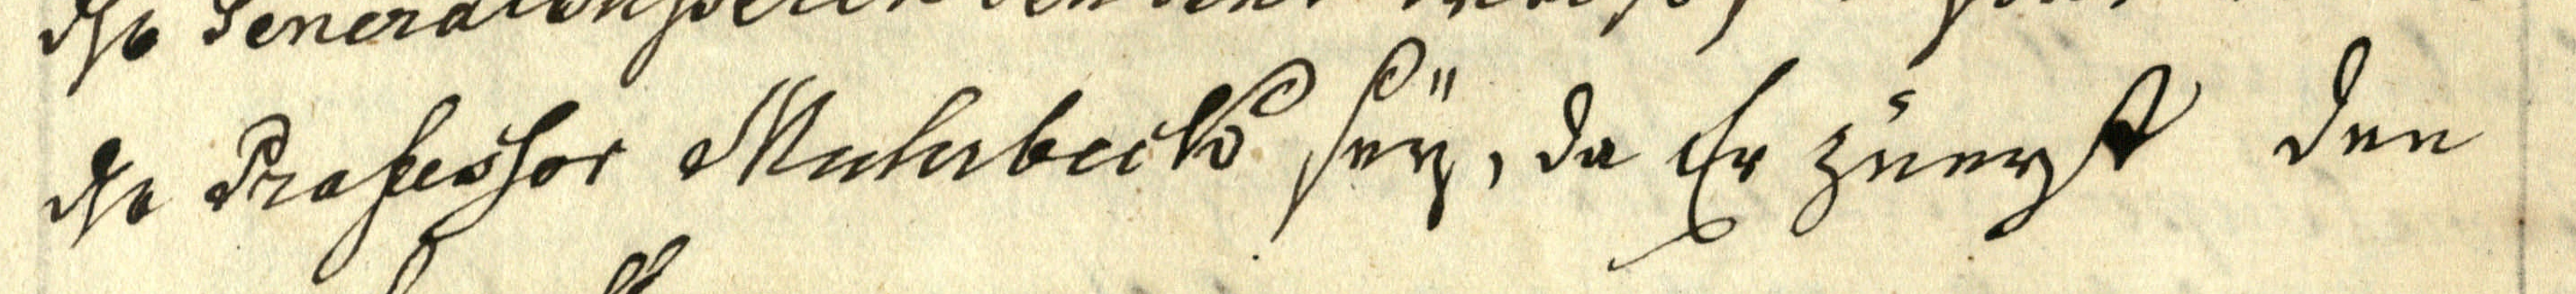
dh Professor Muhrbeck seÿ, da Er zuerst den
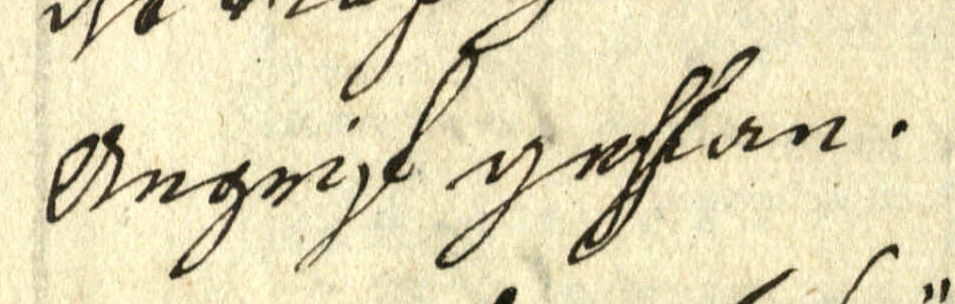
Angrif gethan.
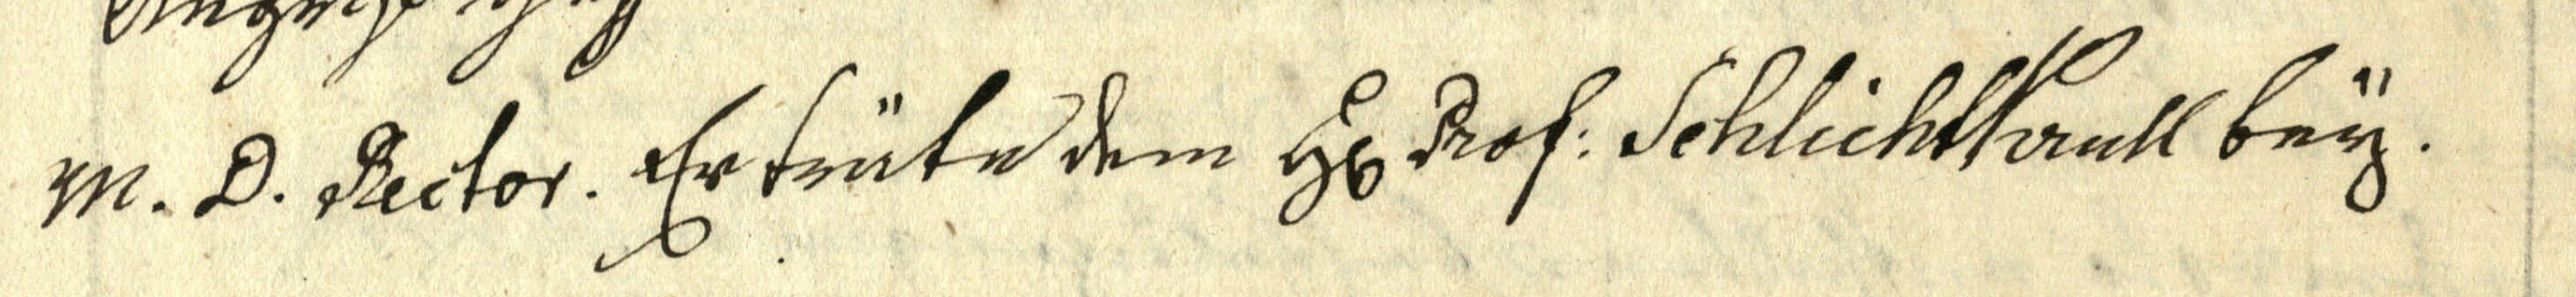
M. D. Rector Er träte dem H Prof. Schlichtkrull beÿ.
